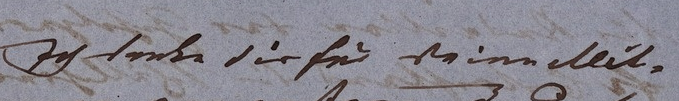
Ich danke dir für Deine Mit-
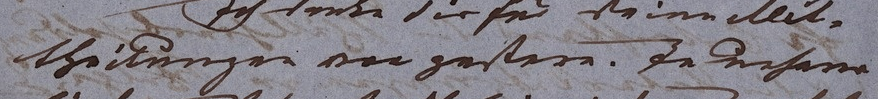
theilungen von gestern. In unserer
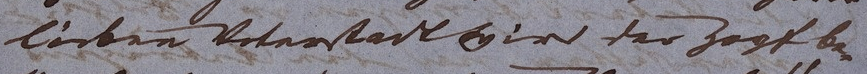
lieben Vaterstadt wird der Zopf be-
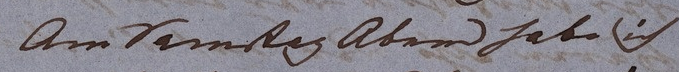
Am Samstag Abend habe ich
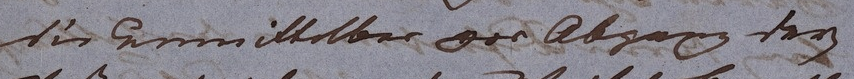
dir unmittelbar vor Abgang der
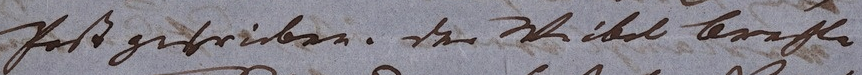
Post geschrieben. Der Weibel brachte
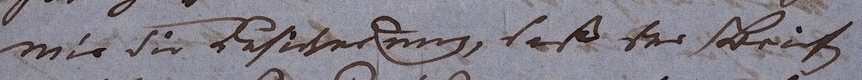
mir die Zusicherung, daß der Brief
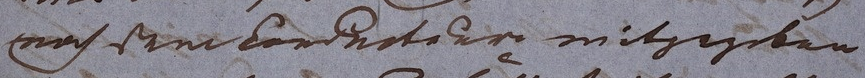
noch dem Conducteure mitgegeben
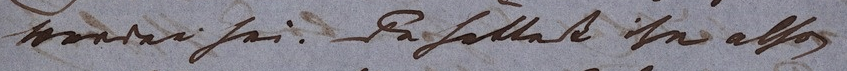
worden sei. Du hättest ihn also
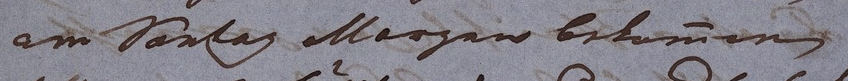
am Sontag Morgen bekommen
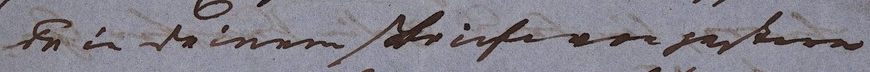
Du in Deinem Briefe von gestern
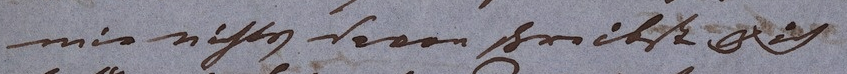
mir nichts davon schreibst & ich
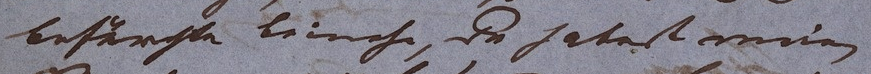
befürchte beinahe, Du habest mein
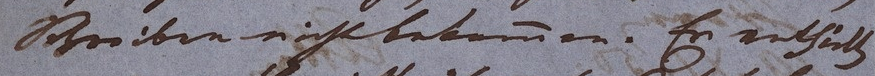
Schreiben nicht bekommen. Es enthielt
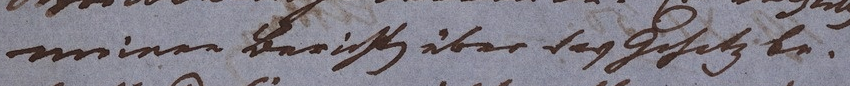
meinen Bericht über das Gesetz be-
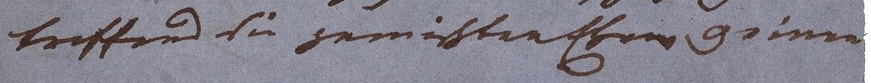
treffend die gemischten Ehen & einen
